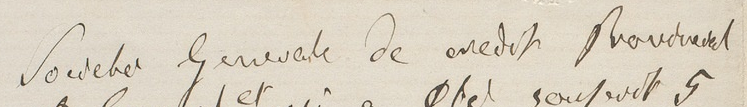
Societé Generale de credit Provincial
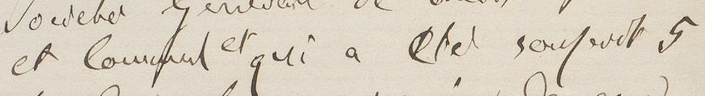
et Comunal et qui a etè souscrit 5
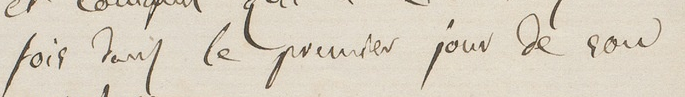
fois dans le premier jour de son
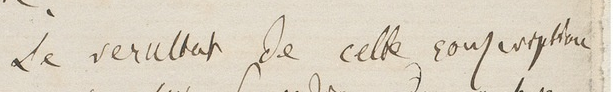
Le resultat de cette souscription
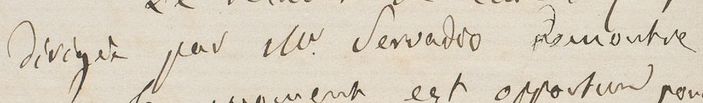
dirigée par MrServadio demontre
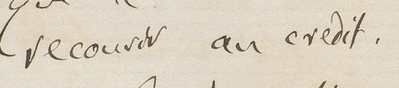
recourir au credit.
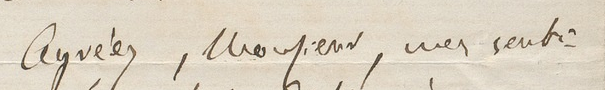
Agréez, Monsieur, mes senti-
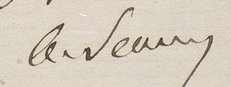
G. Scanzi
